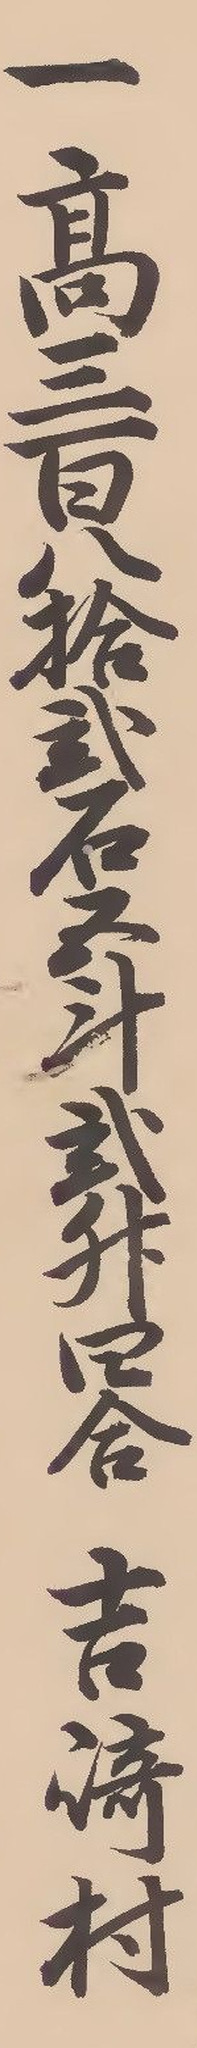一高三百八拾弐石五斗弐升四合吉崎村

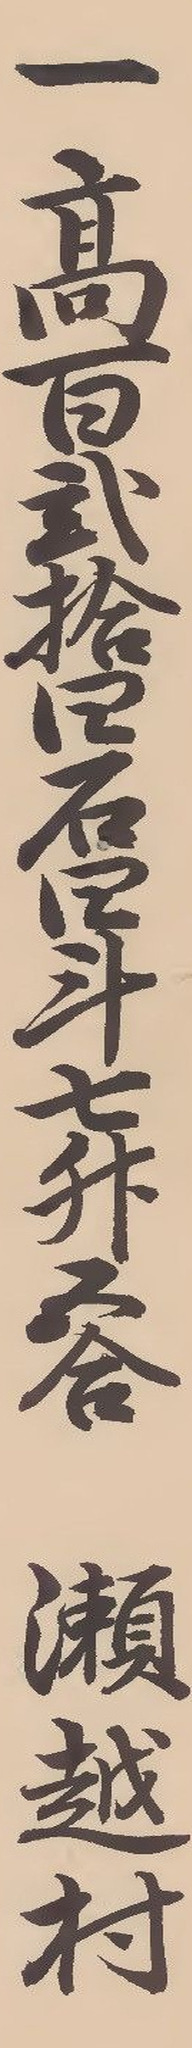一高百弐拾四石四斗七升五合瀬越村
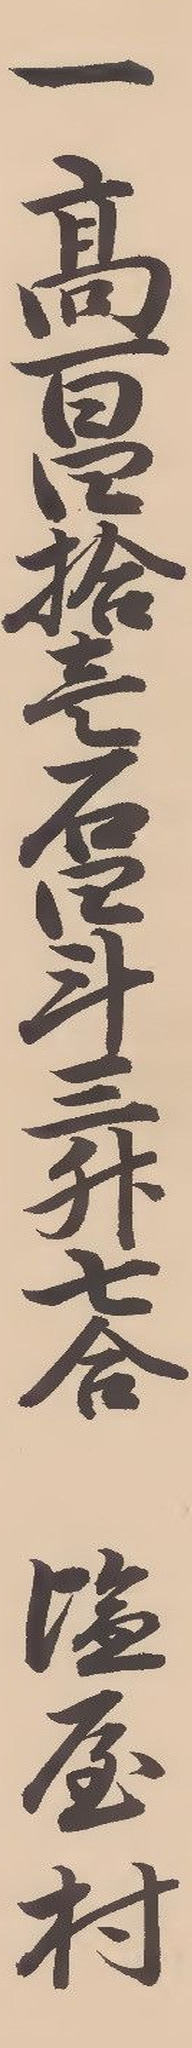一高百四拾壱石四斗三升七合塩屋村
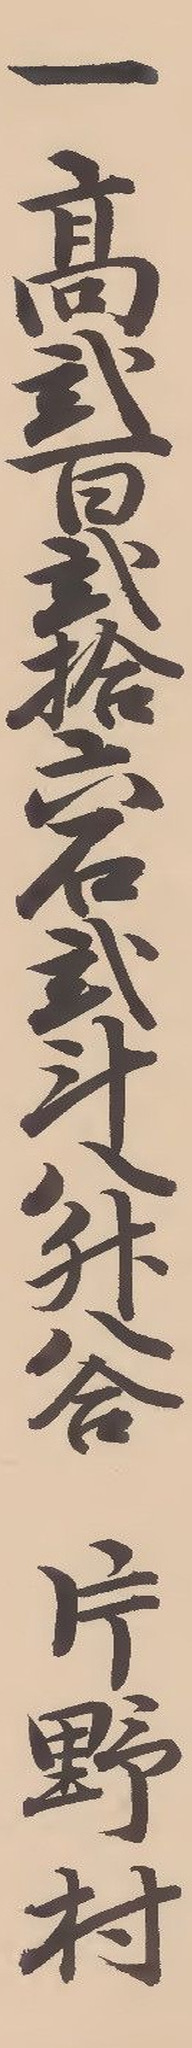一高弐百弐拾六石弐斗八升八合片野村
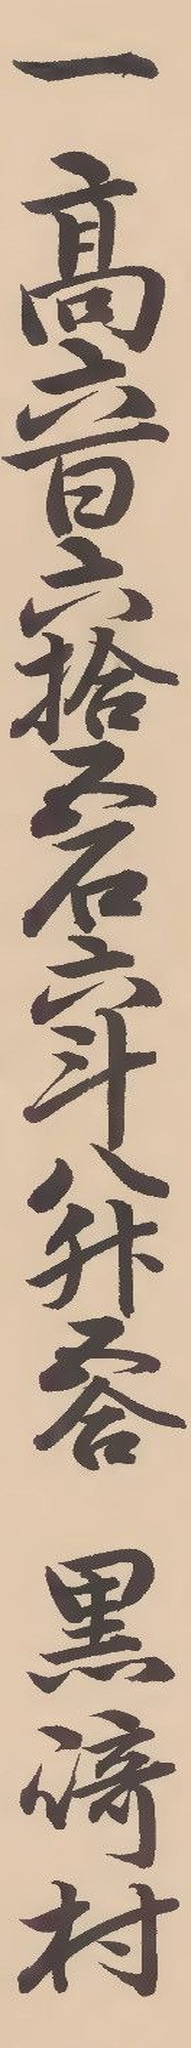一高六百六拾五石六斗八升五合黒崎村
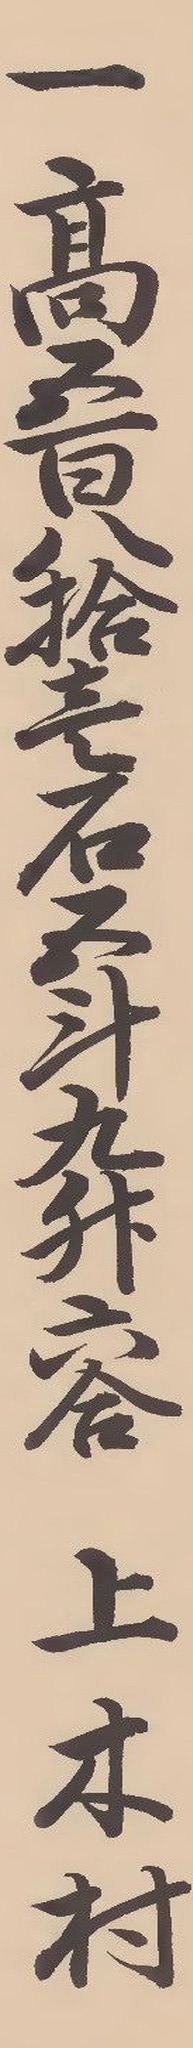一高五百八拾壱石五斗九升六合上木村
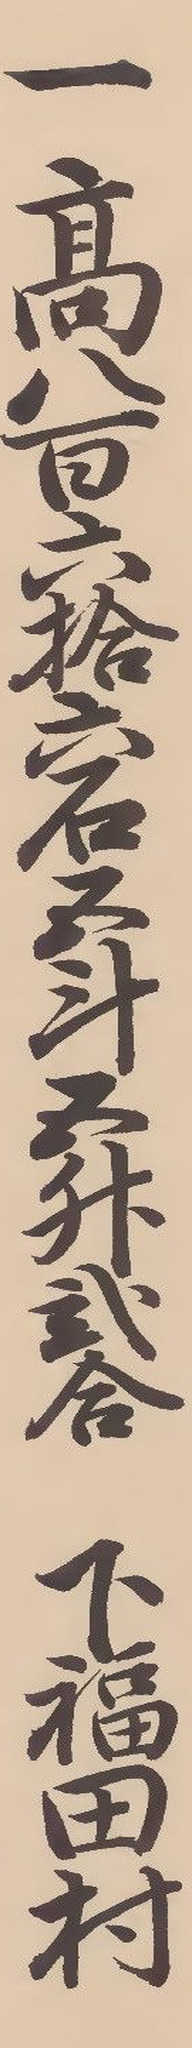一高八百六拾六石五斗五升弐合下福田村
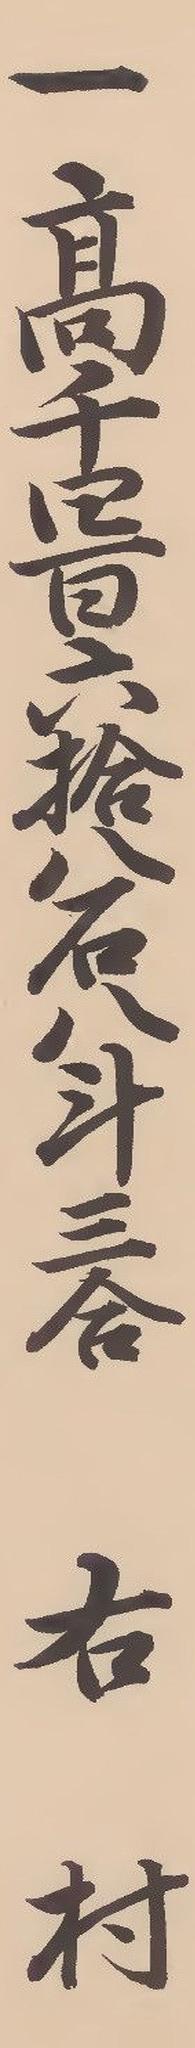一高千四百六拾八石八斗三合右村
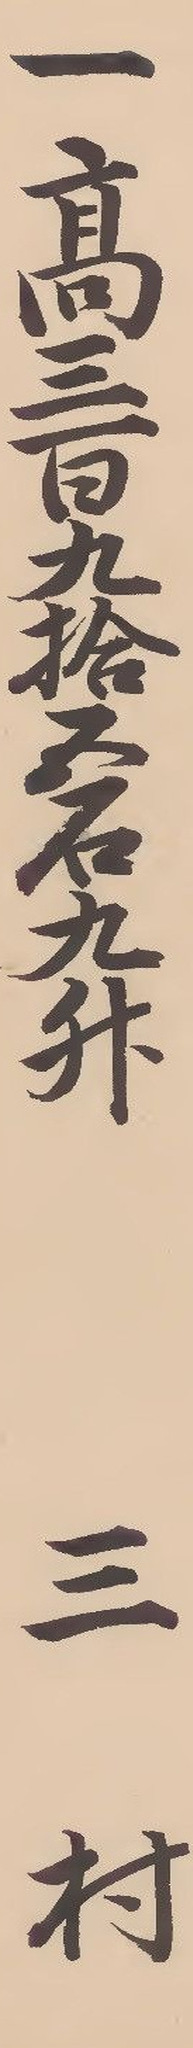一高三百九拾五石九升三村

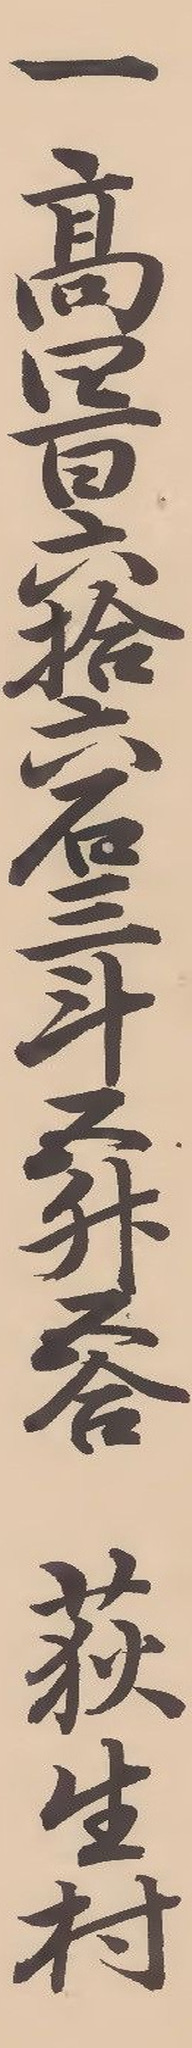一高四百六拾六石三斗五升五合荻生村
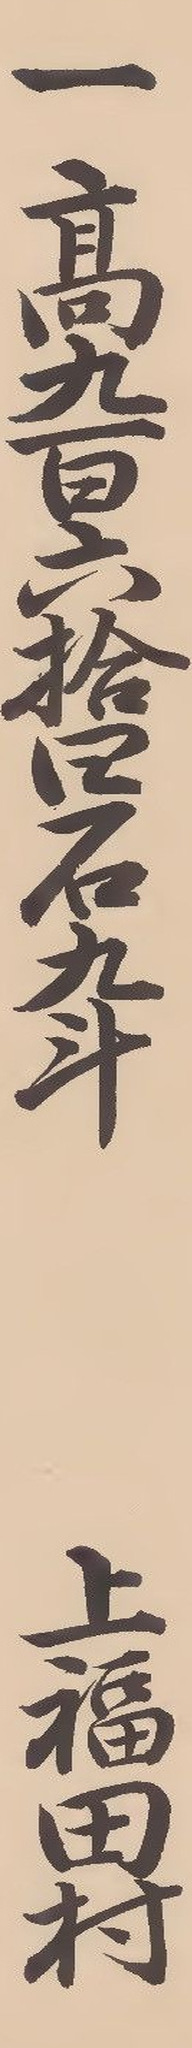一高九百六拾四石九斗上福田村
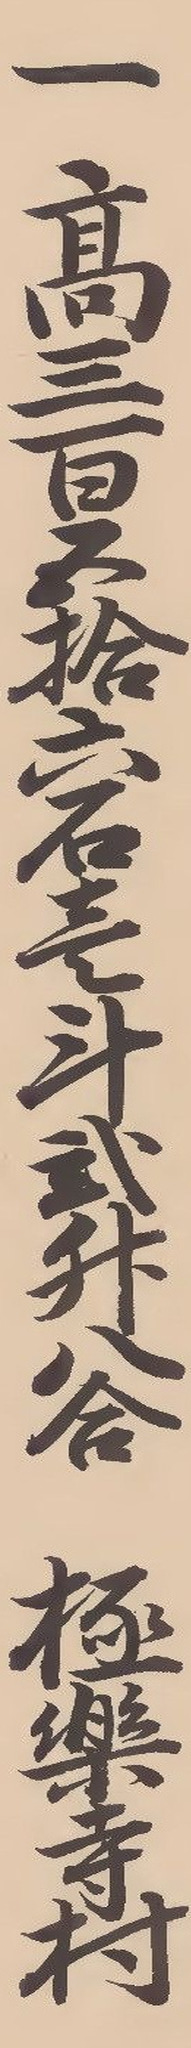一高三百五拾六石壱斗弐升八合極楽寺村
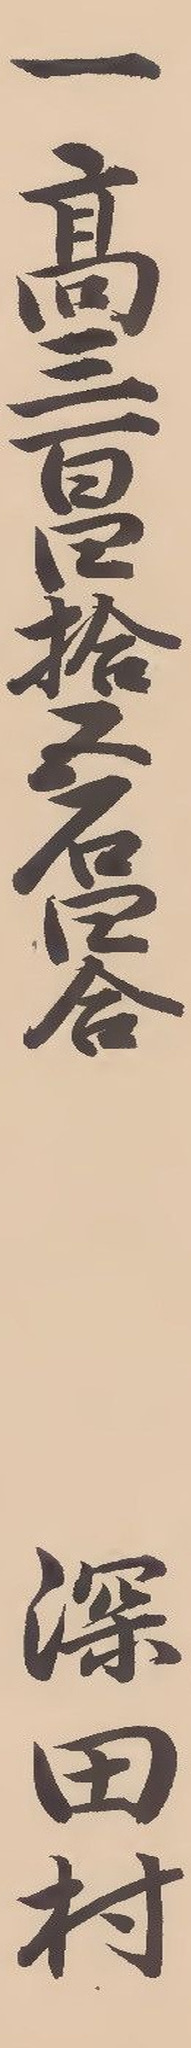一高三百四拾五石四合深田村
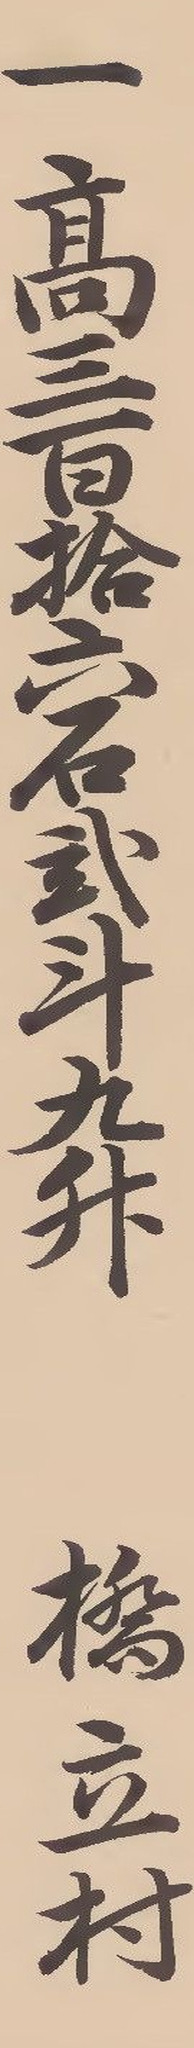一高三百拾六石弐斗九升橋立村
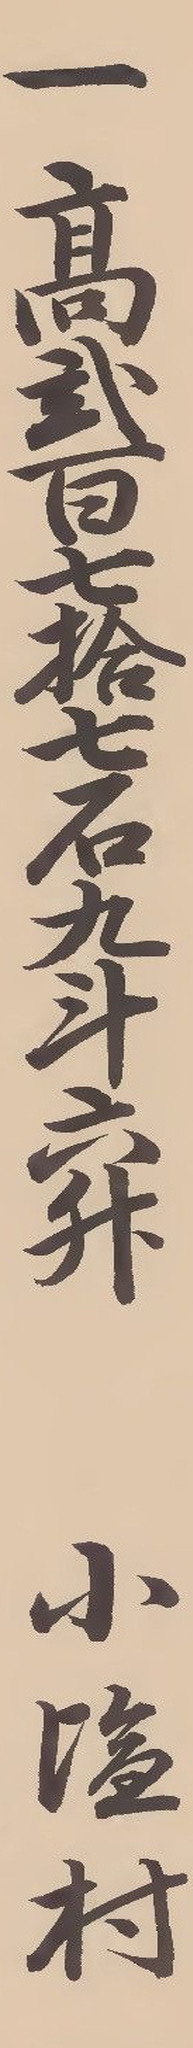一高弐百七拾七石九斗六升小塩村
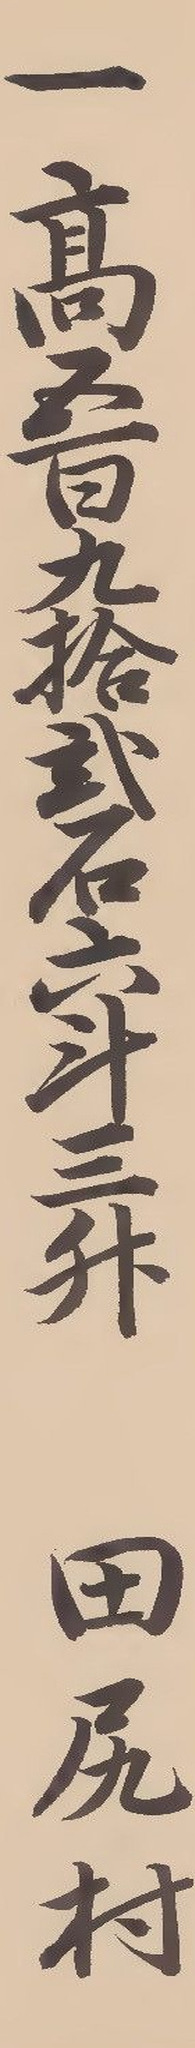一高五百九拾弐石六斗三升田尻村
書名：加賀国郷帳
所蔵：国立公文書館 National Archives of Japan
